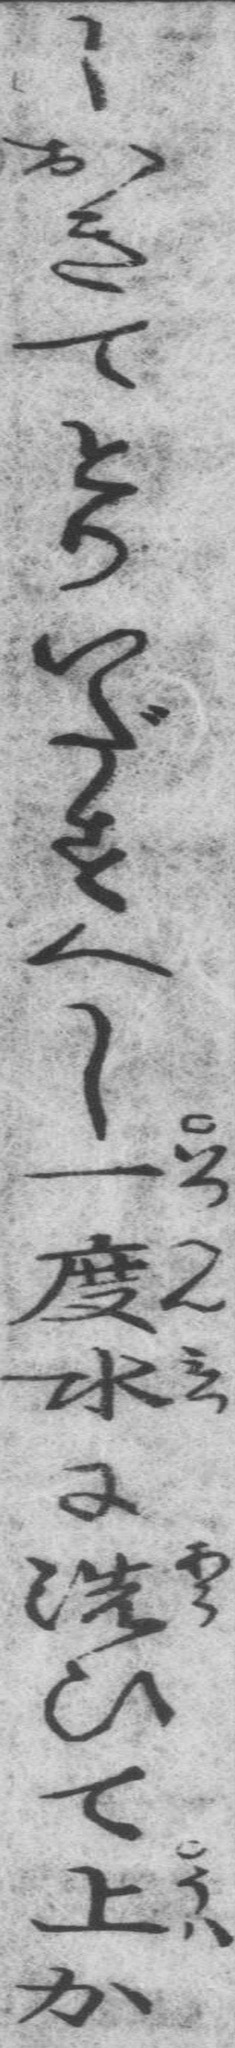しおきてとりいだすへし。一度水に洗ひて。上か

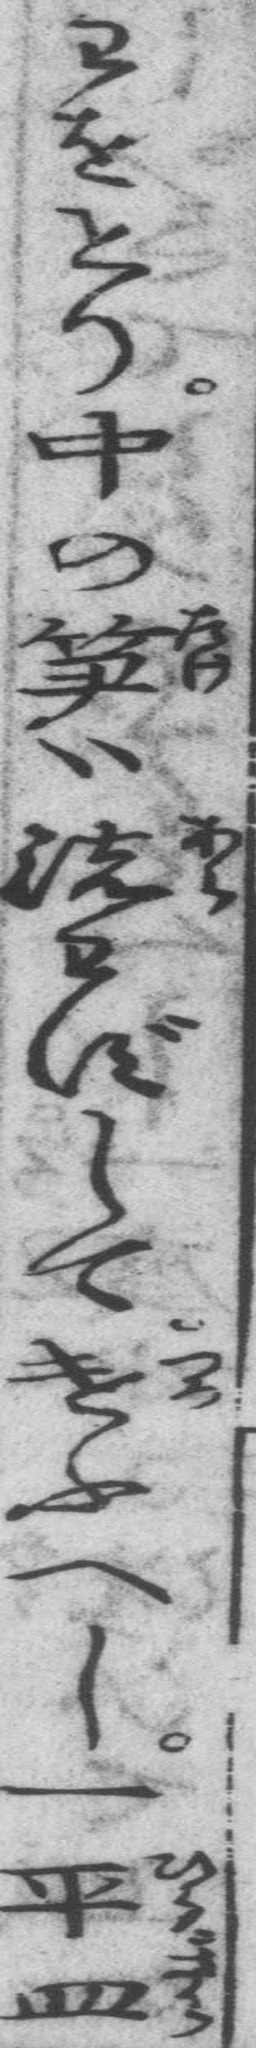わをとり。中の笋は洗わずして。遣ふへし。一平皿
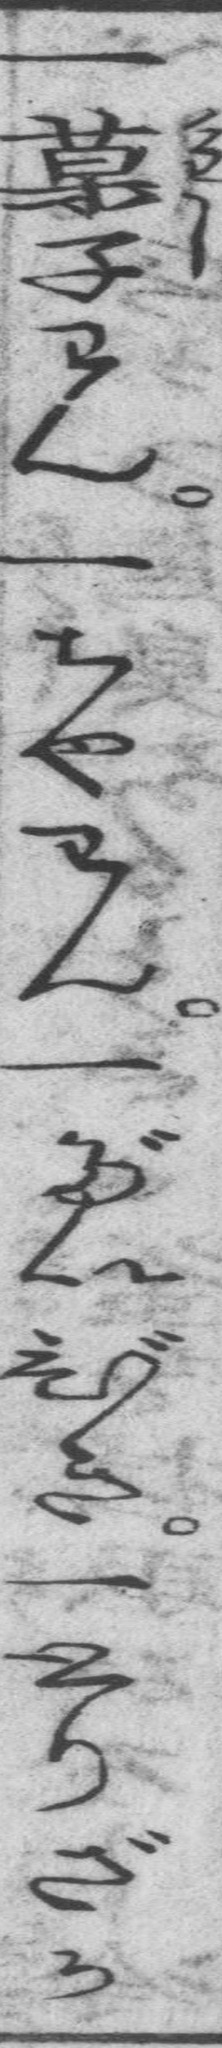一菓子わん。一ちやわん。一だいびき。一とりざか
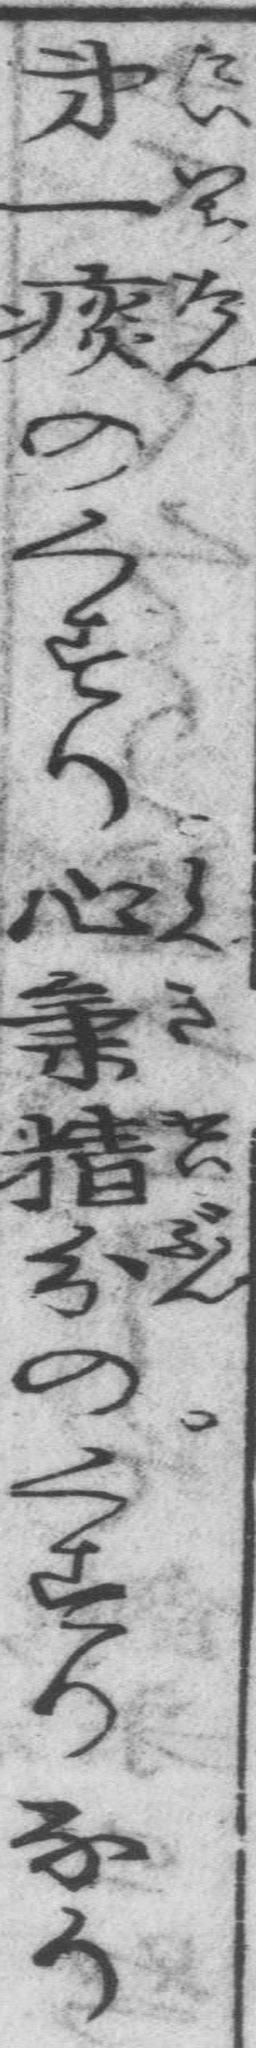第一痰のくすり。心気精分の。くすりなり
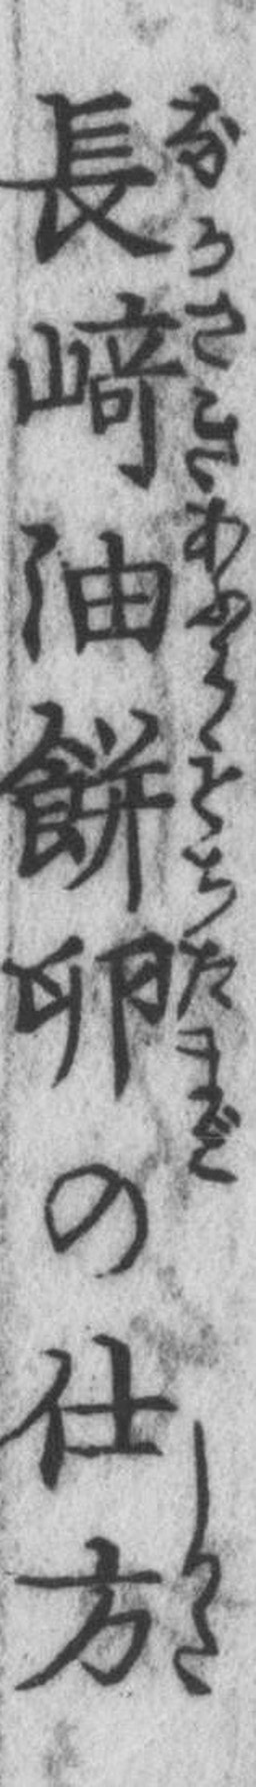長崎油餅卵の仕方
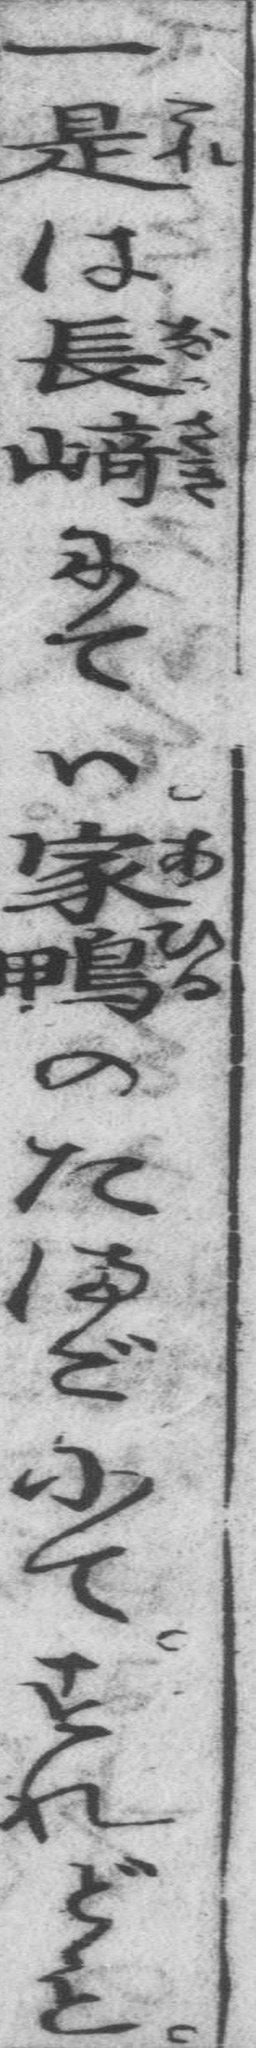一是は長崎にては。家鴨のたまごにて。すれども。
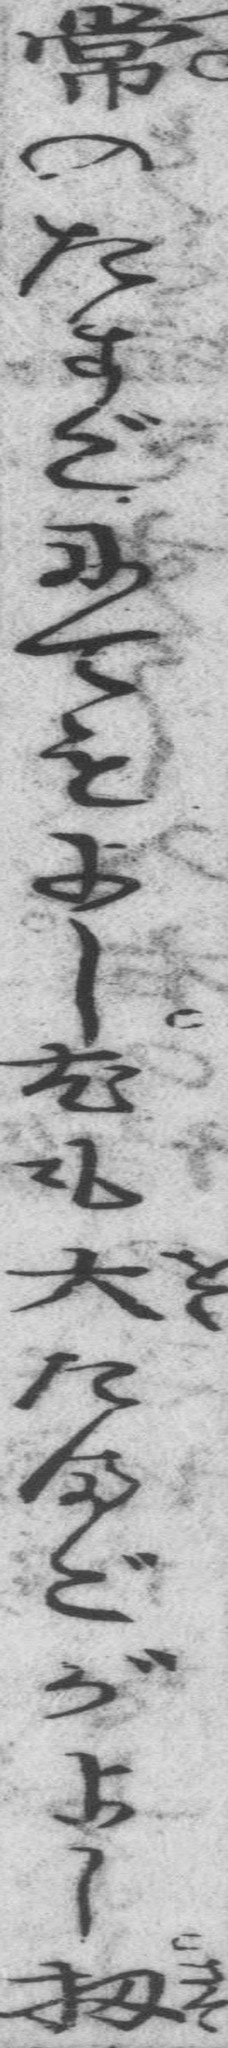常のたまごにてもよし。尤も大たまごがよし。扨
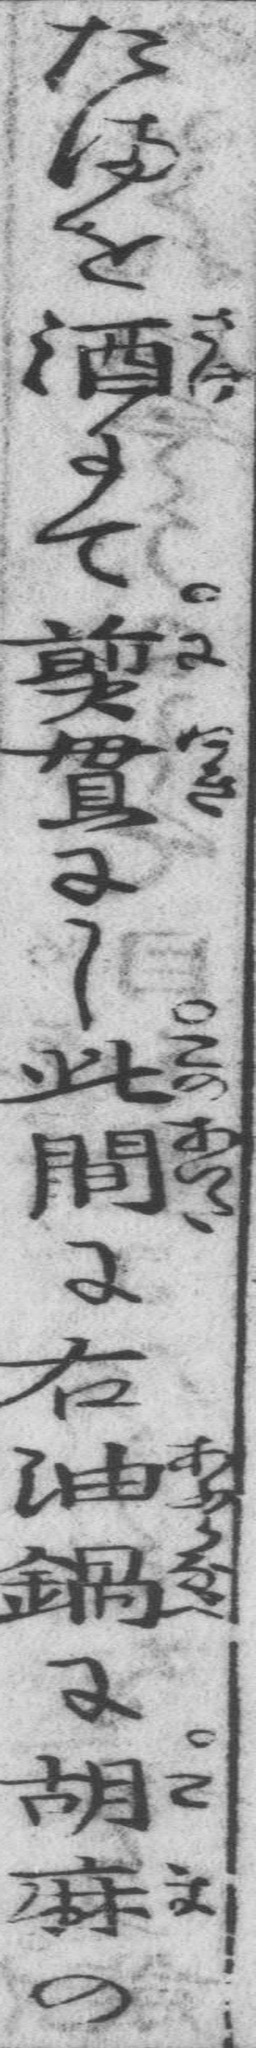たまを酒にて。煎貫にし。此間に右油鍋に。胡麻の
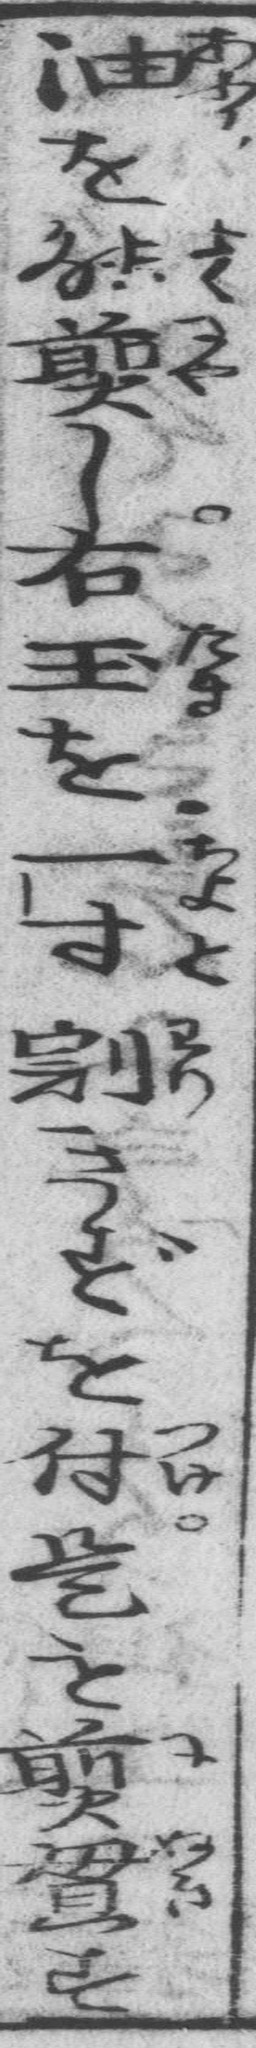油を能煎し。右玉を。一寸割きずを付。是も煎貫す
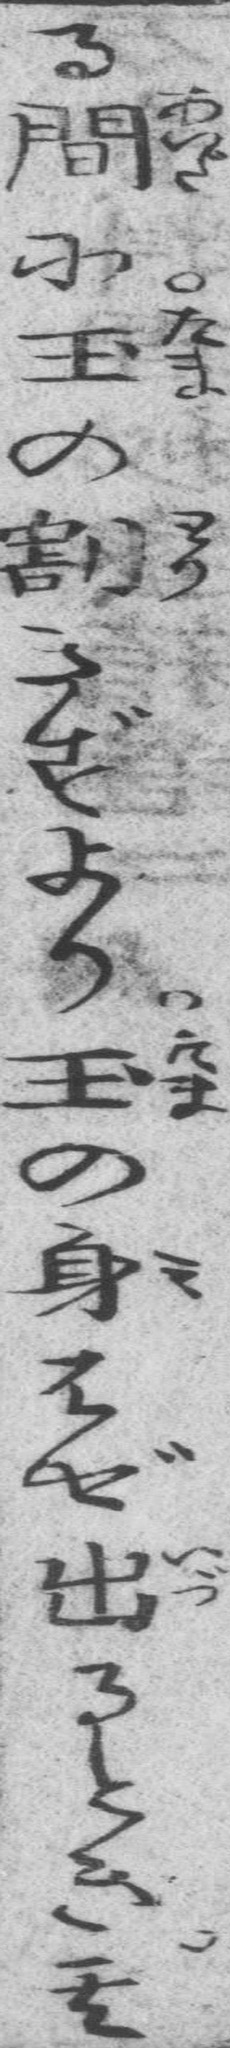る間に。玉の割きずより。玉の身はぜ出るとき。其
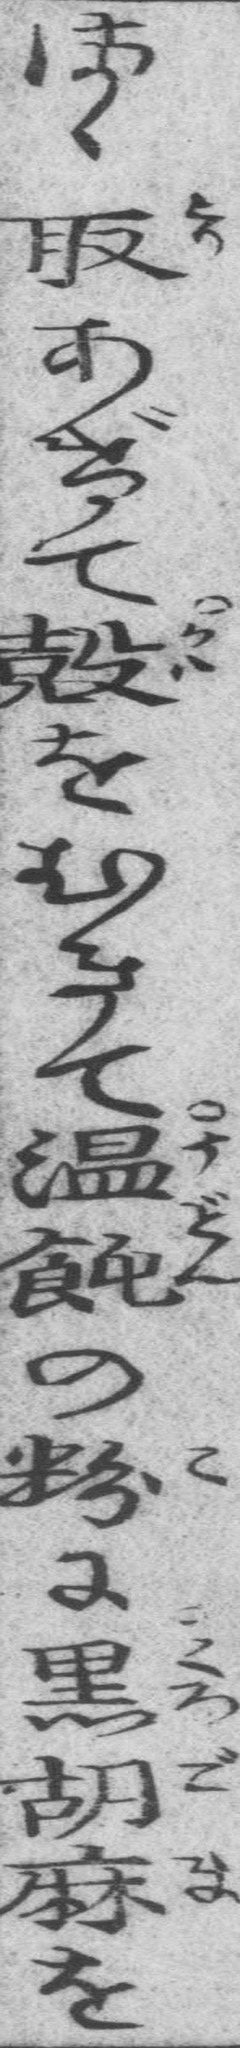まゝ取あげて。殻をむきて。饂飩の粉に。黒胡麻を
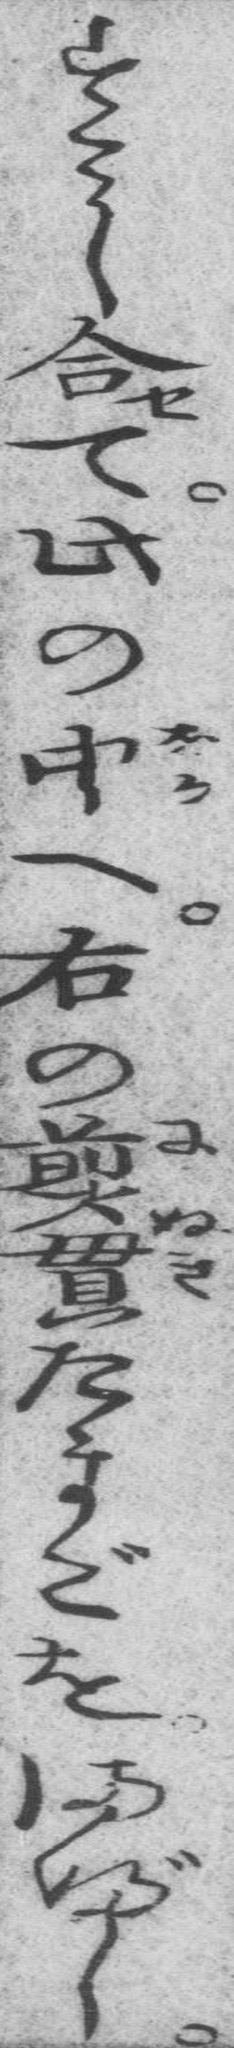すこし合せて。此の中へ。右の煎貫たまごをまぶし。
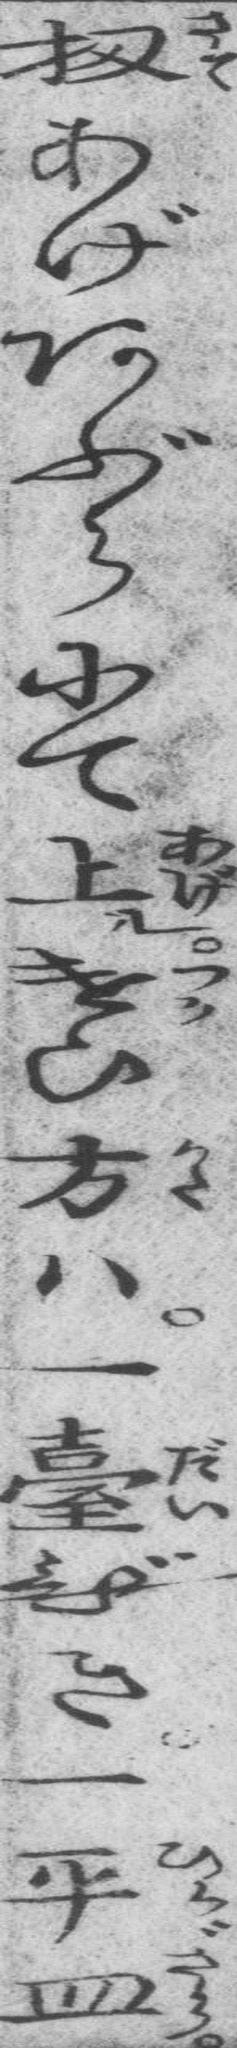扨あげあぶらにて上る。遣ひ方は。一台びき。一平皿。
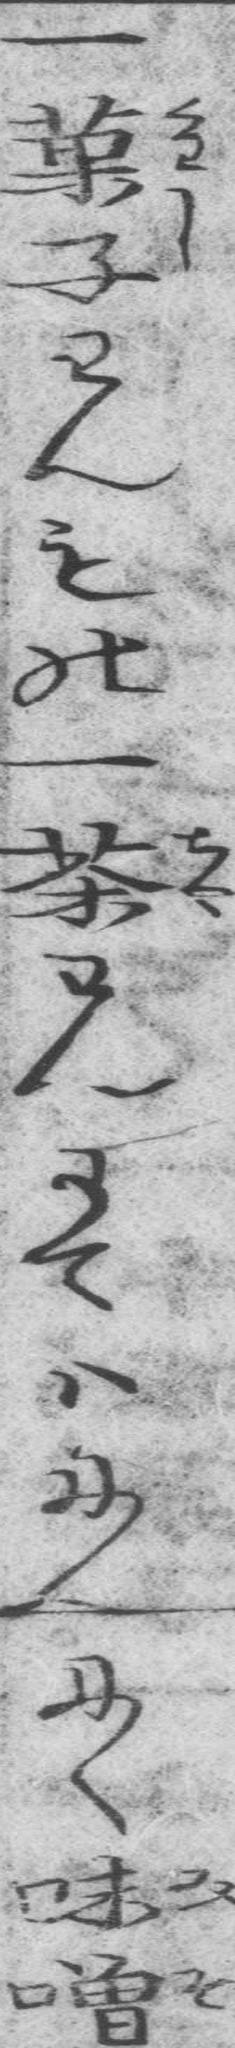一菓子わんもの一茶わんにてはにんにく味噌
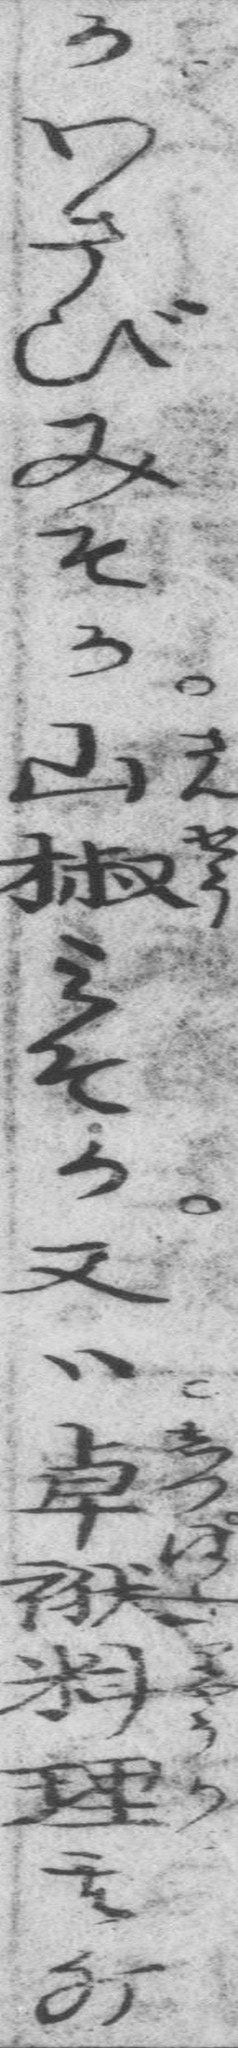かわさびみそか。山椒みそか。又は。卓袱料理其外
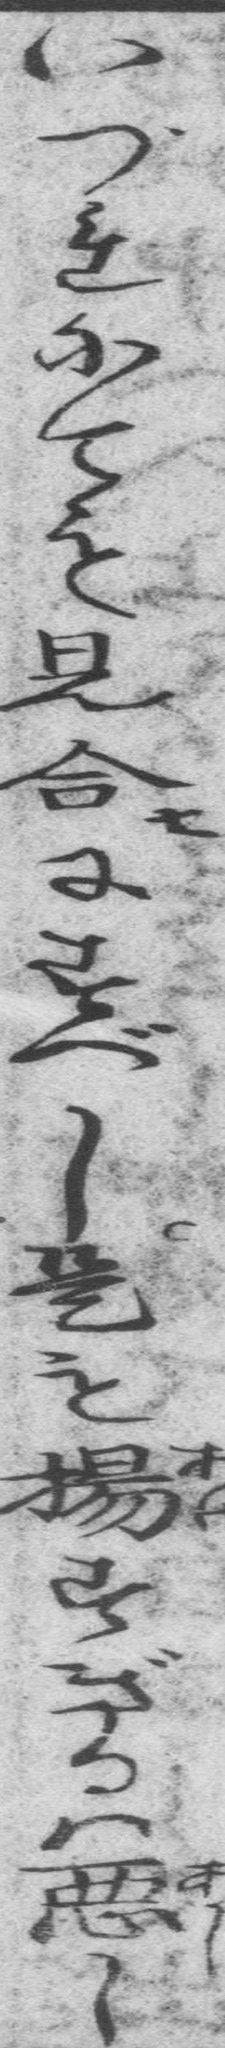いづれにても見合せにすべし。是も揚すぎるは悪し
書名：萬寳料理秘密箱
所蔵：大阪府立大学学術情報センター 国文学研究資料館
